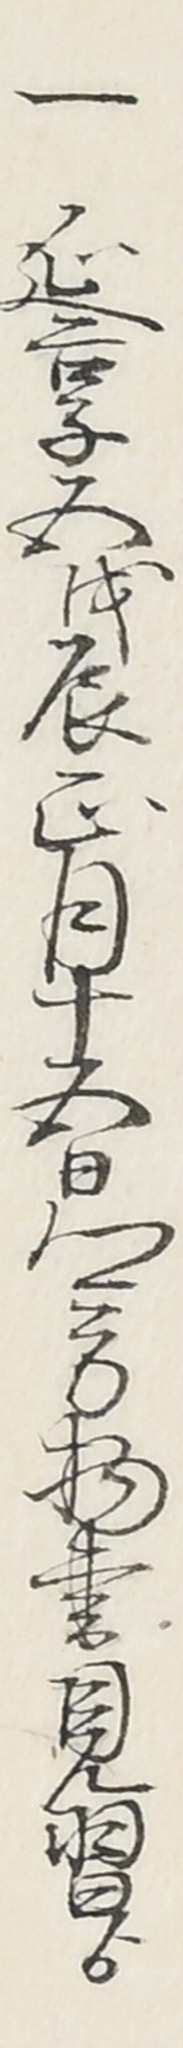一延享五戊辰正月十五日郷方物書見習ゟ
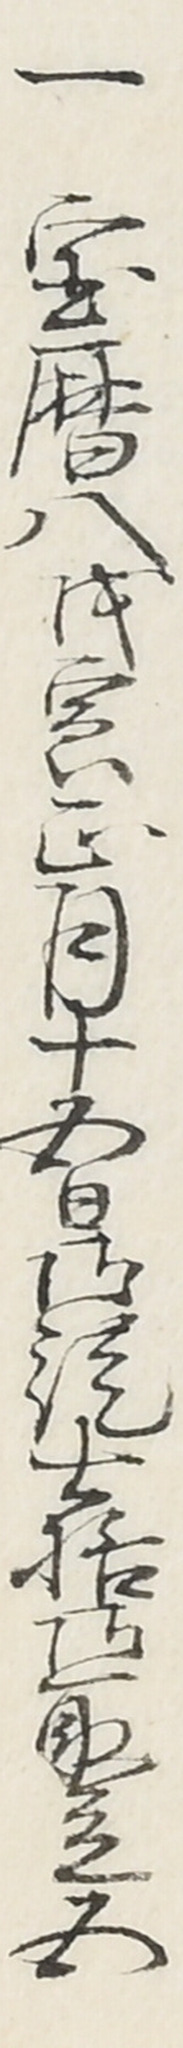一宝暦八戊寅正月十五日御徒士格御取立五
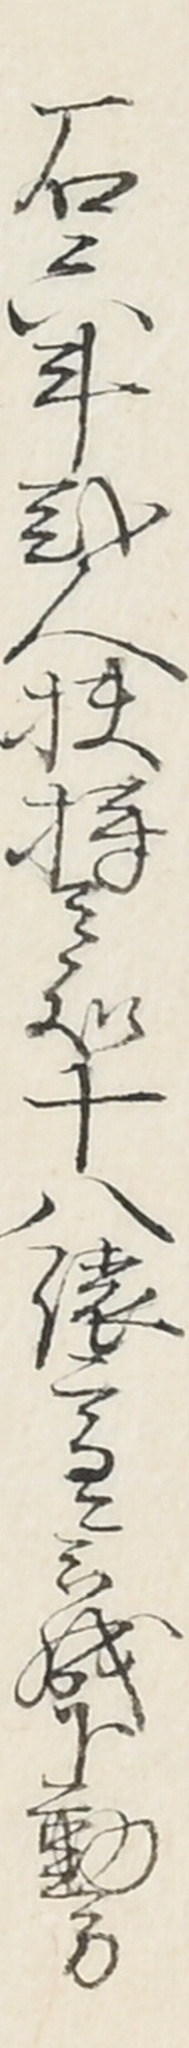石六斗弐人扶持之処十八俵高ニ被成下勤方
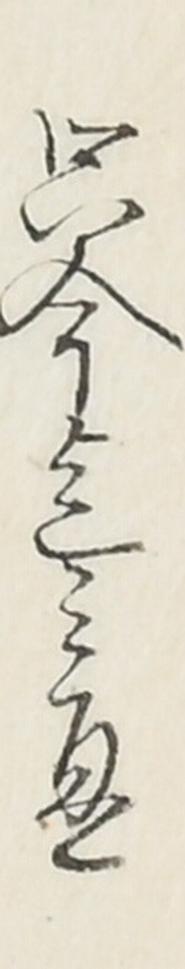只今迄之通
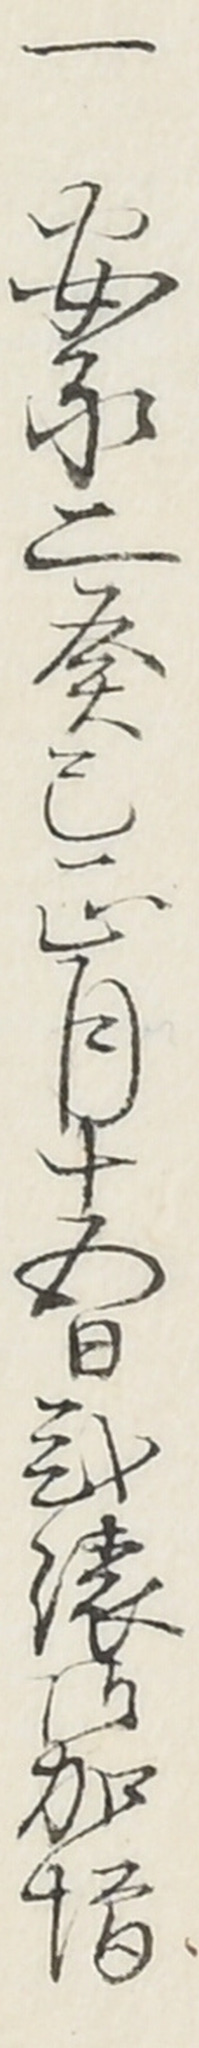一安永二癸巳正月十五日弐俵御加増
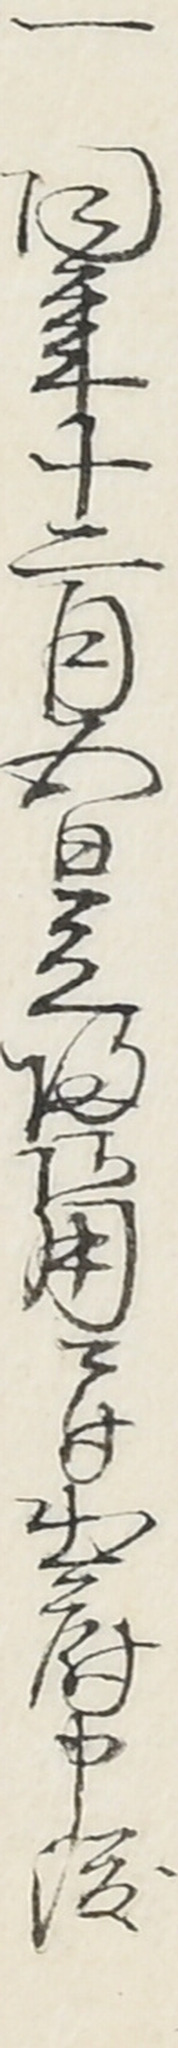一同年十二月五日立帰御用ニ付出府申渡
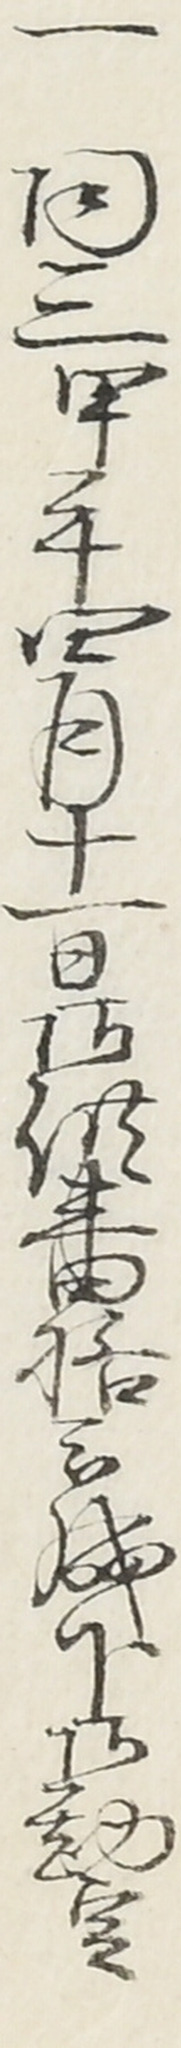一同三甲午四月十一日御供格被成下御勘定
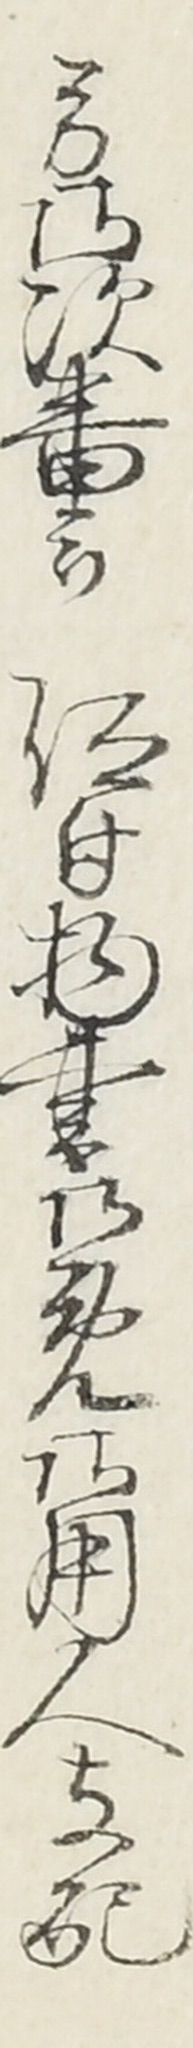方御次番方仰付物書御免御用人支配
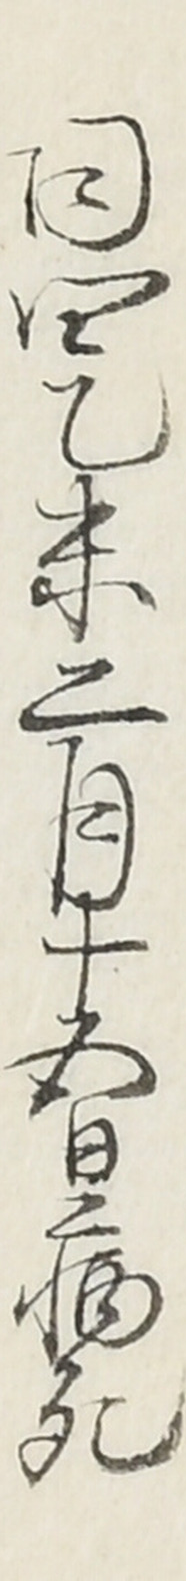一同四乙未二月十五日病死
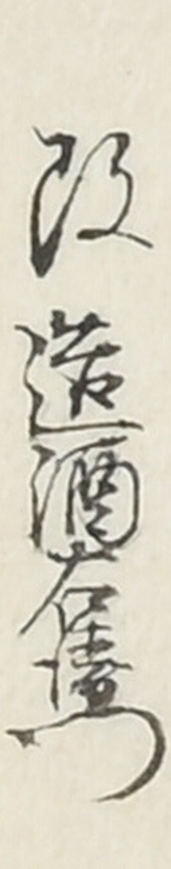改造酒右衛門
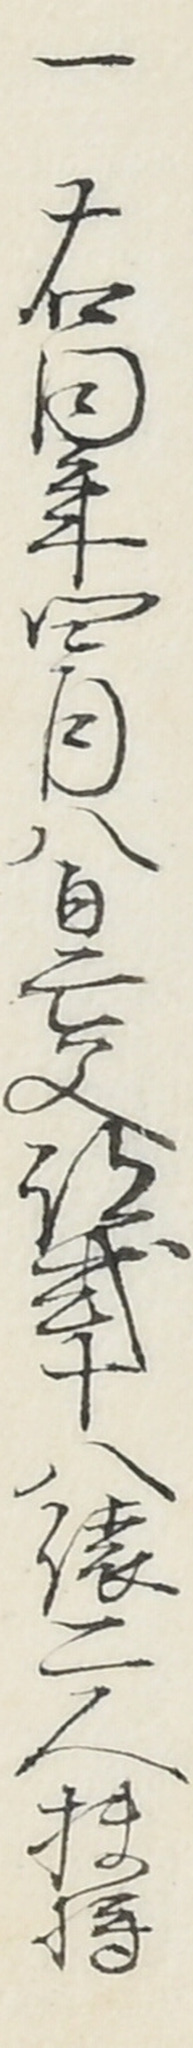一右同年四月八日亡父跡式十八俵二人扶持
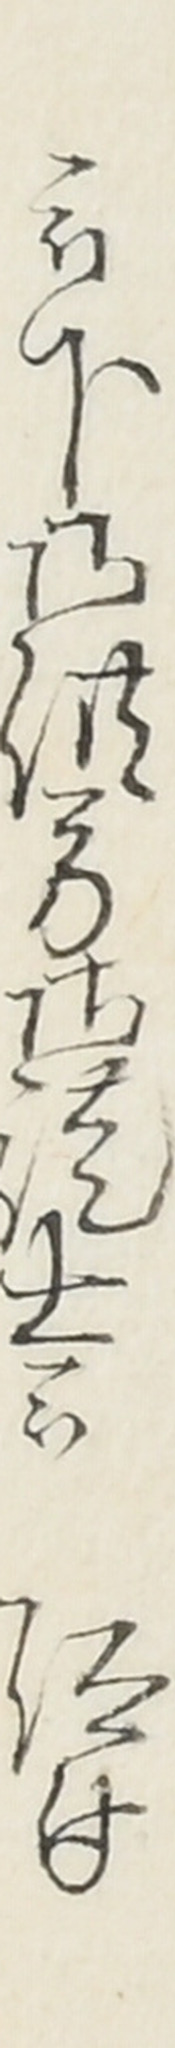被下御供方御徒士被仰付

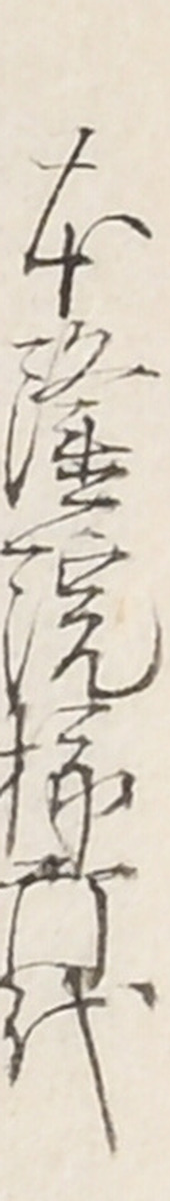本隆院様御代
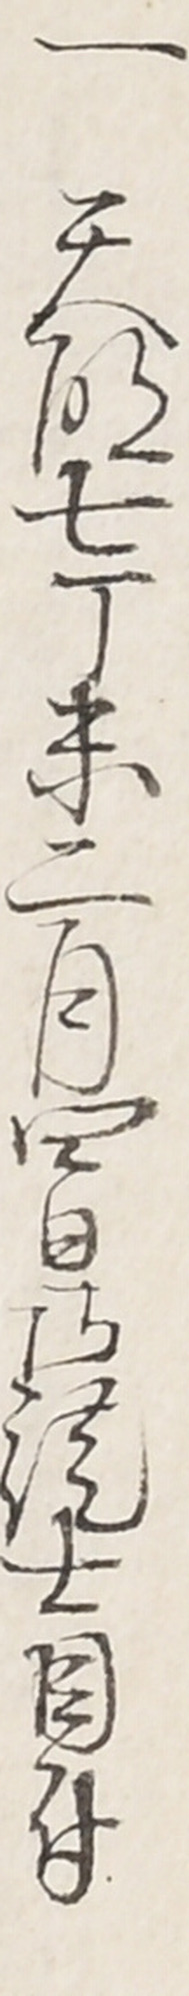一天明七丁未二月四日御徒士目付
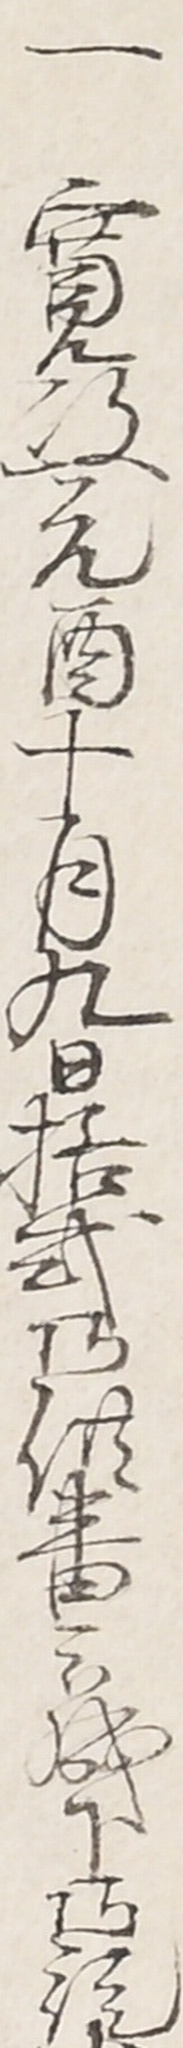一寛政元酉十月九日格式御供番被成下御徒士
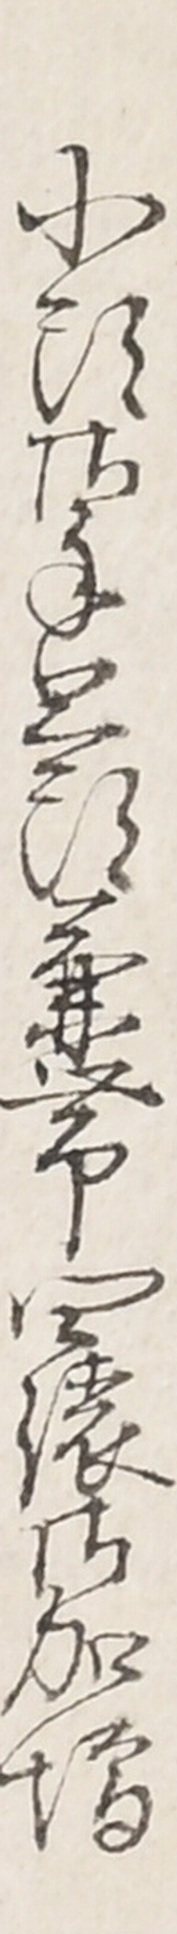小頭御手廻頭兼帯四俵御加増
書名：無足諸士勤仕録（四）
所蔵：伊那市立高遠町図書館・合同会社AMANE
